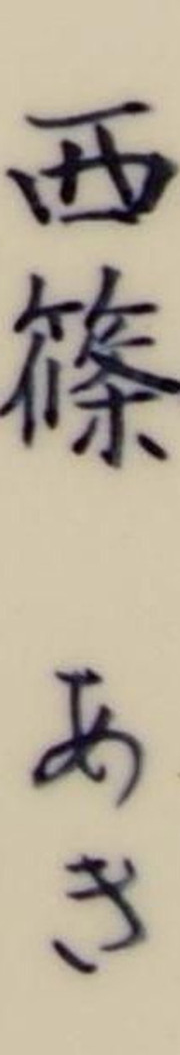西篠あき
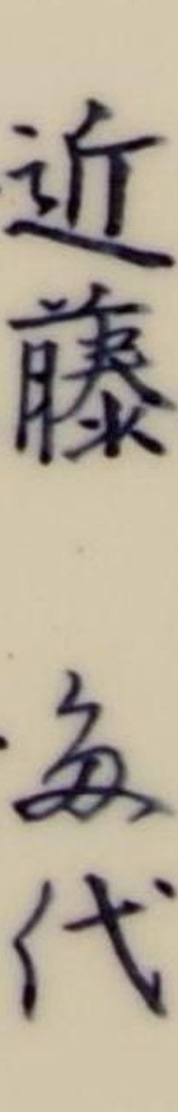近藤多代
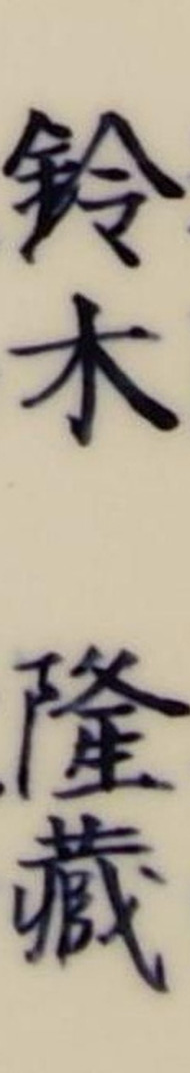鈴木隆蔵
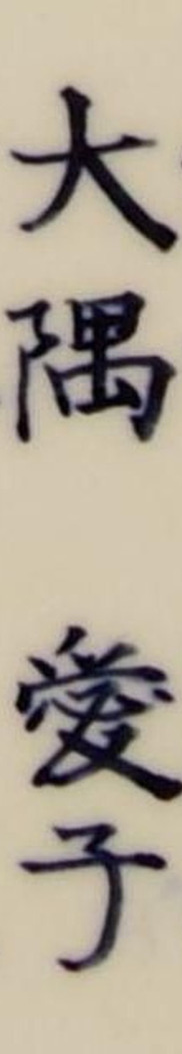大隅愛子
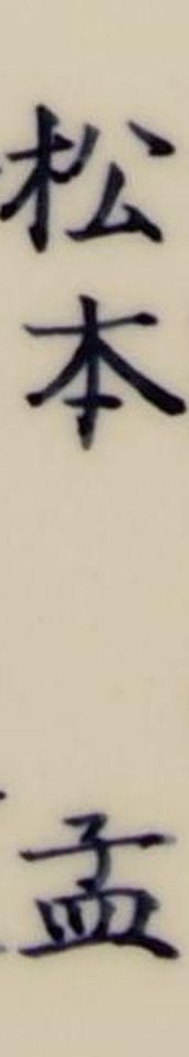松本盂
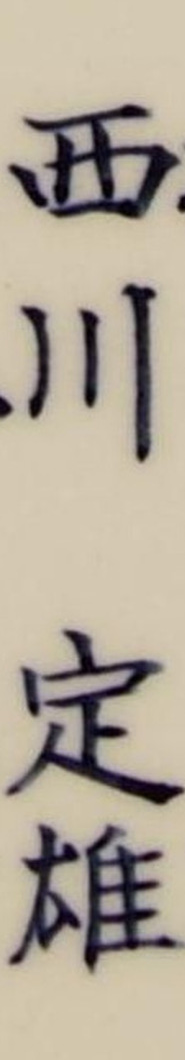西川定雄
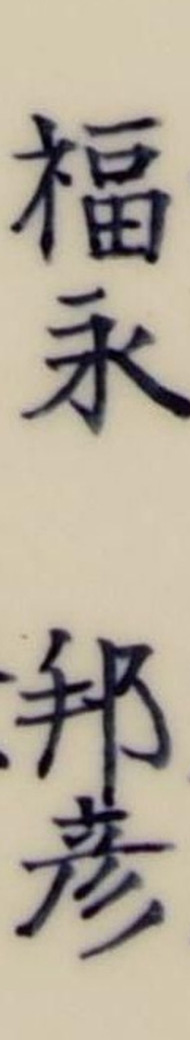福永邦彦
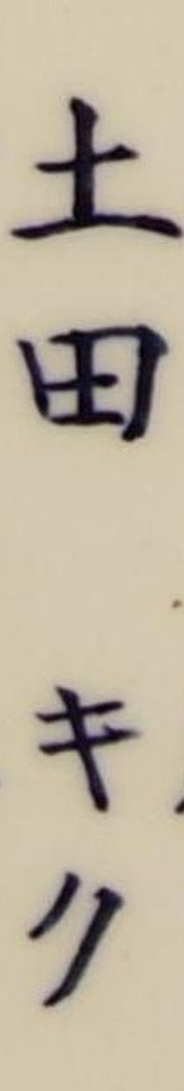土田キク
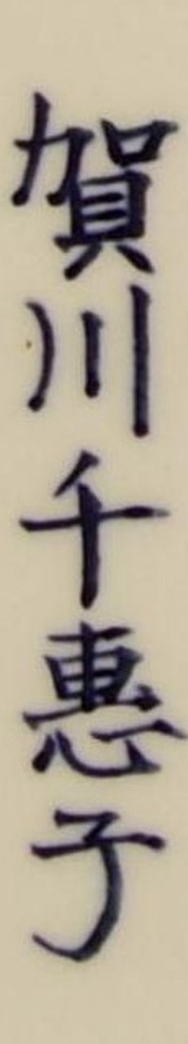賀川千惠子
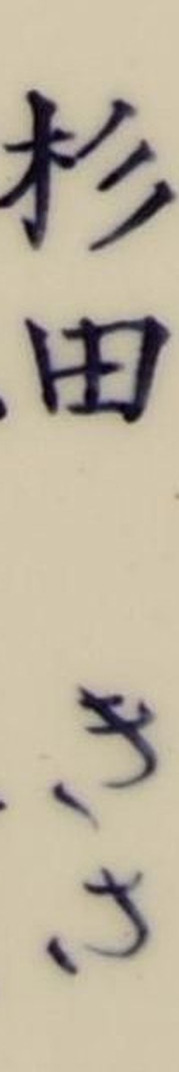杉田きさ
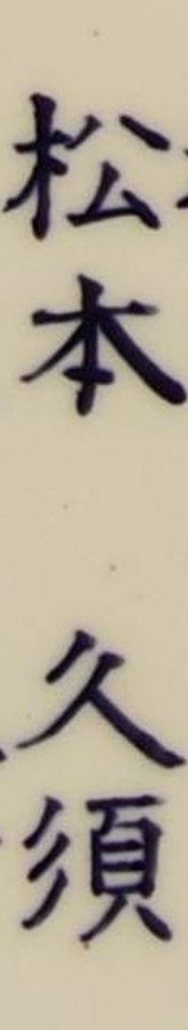松本久須
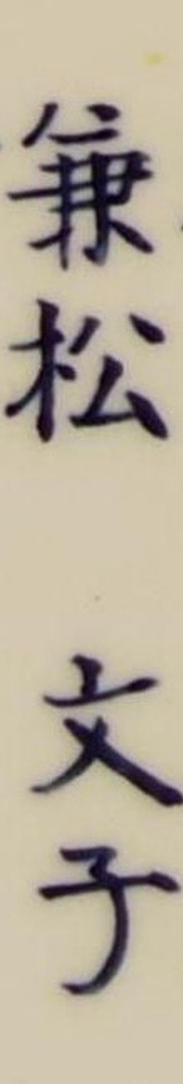兼松文子
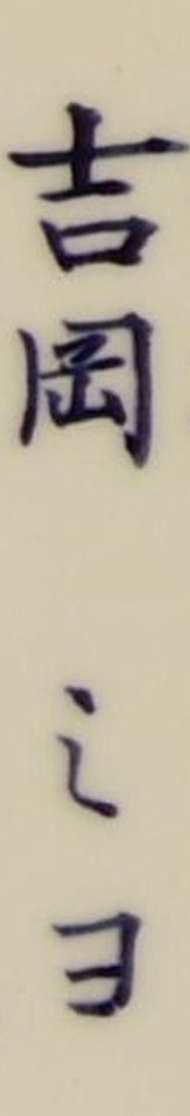吉岡之ヨ
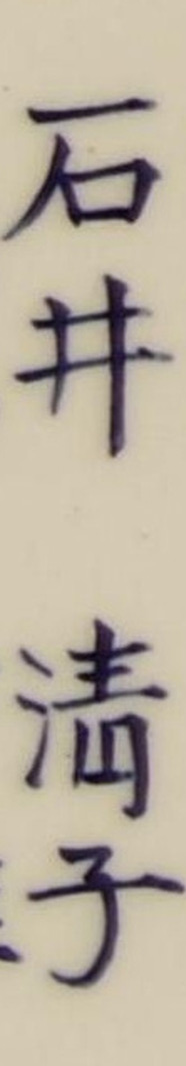石井清子
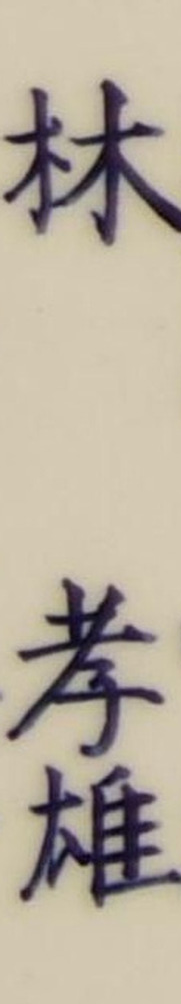林孝雄

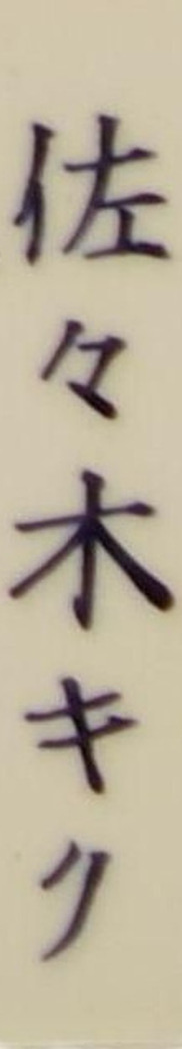佐々木キク
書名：E~L
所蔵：高野山金剛峯寺
